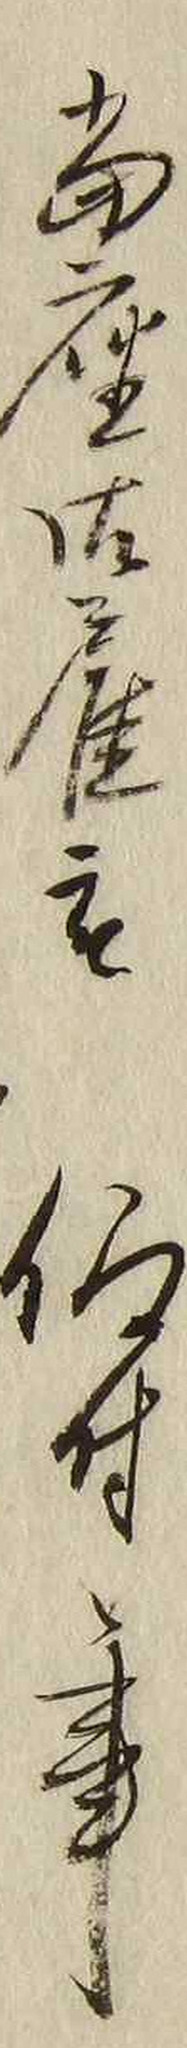当座御雇被仰付候事
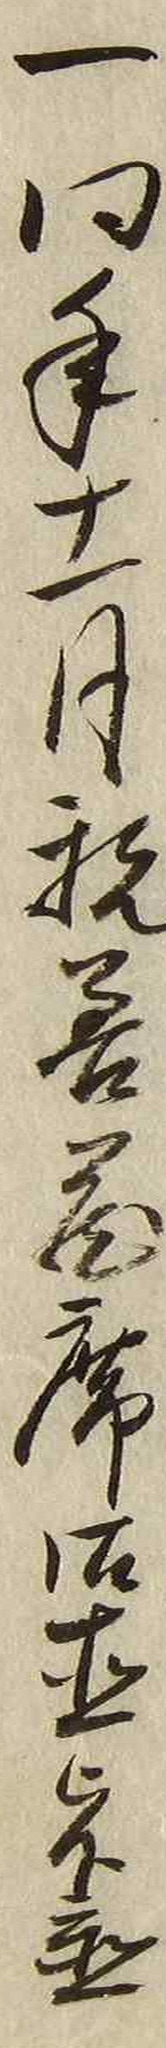一同年十一月親善蔵席御直被下置

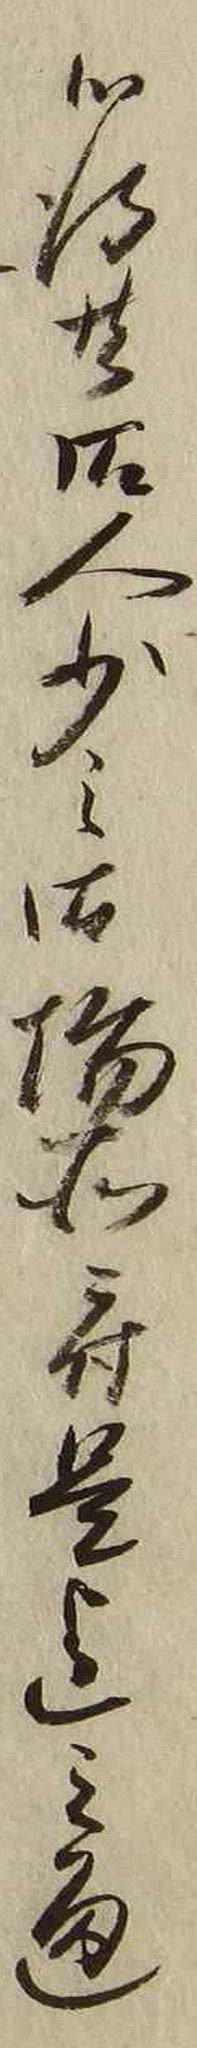候得共御人少之御場所ニ付是迄之通
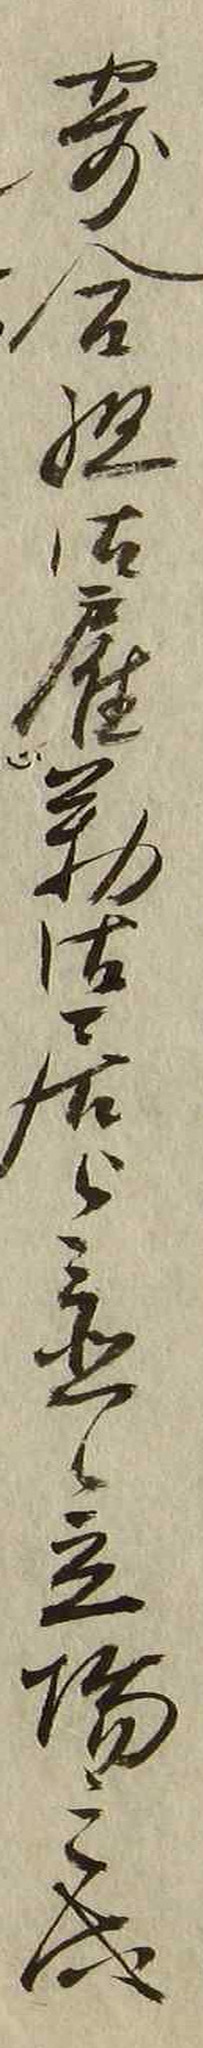寄合組御雇勤御居被置候立場之儀
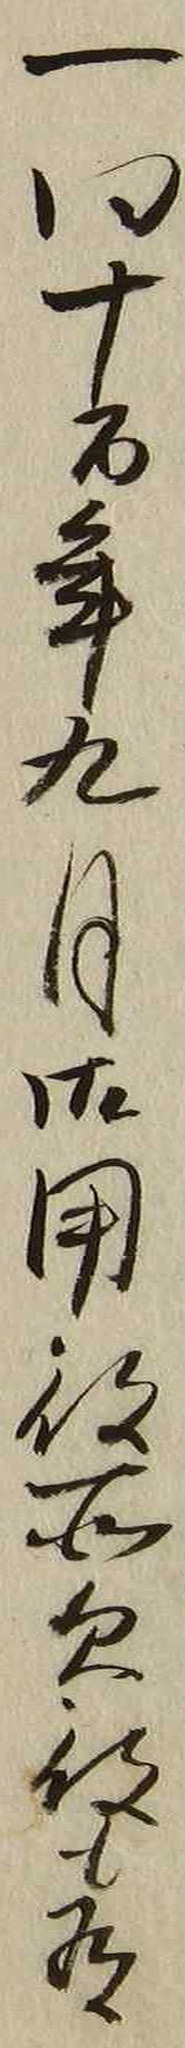一同十酉年九月御用役所欠役も有
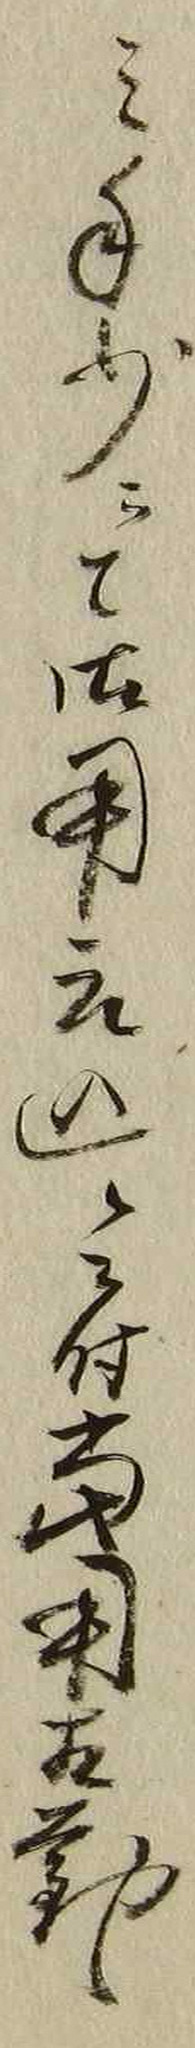之手少ニて御用取込候ニ付当用相勤候
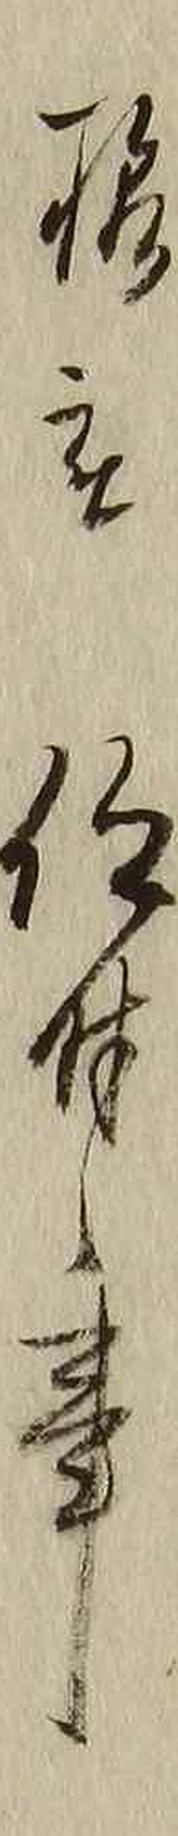様被仰付候事
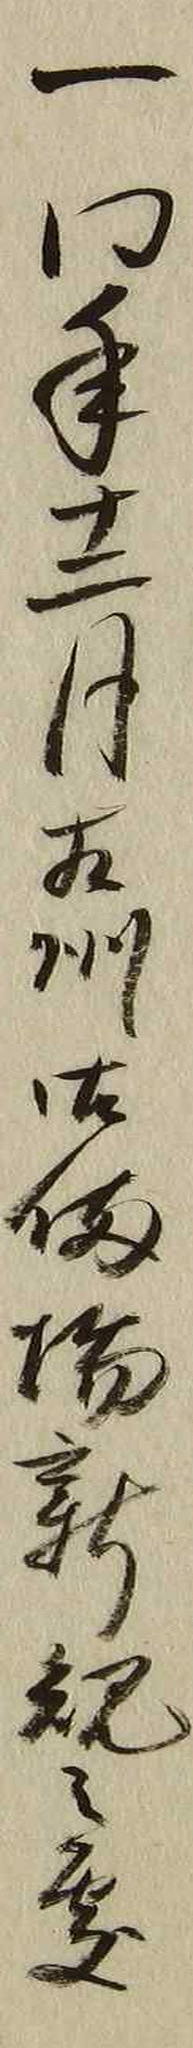一同年十二月相州御備場新規之処
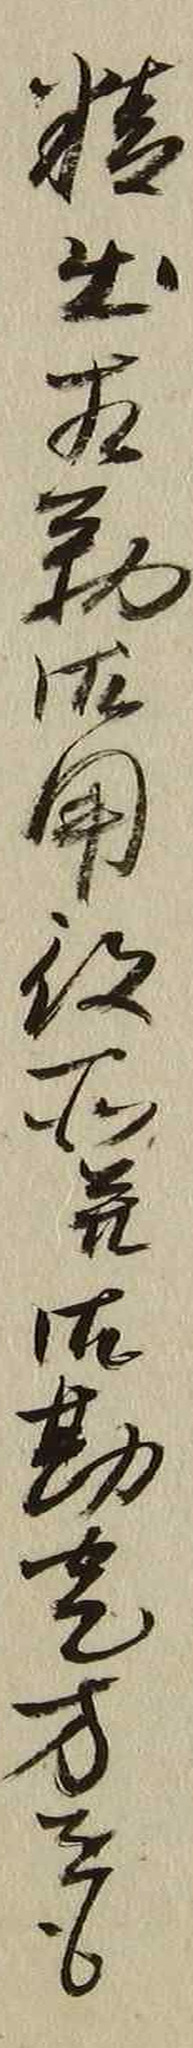精出相勤御用役所并御勘定方をも
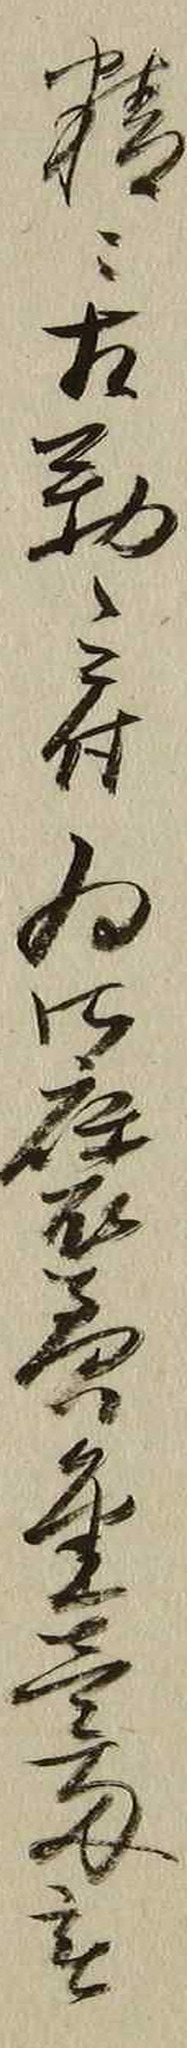精々相勤候ニ付為御褒美金壱両被
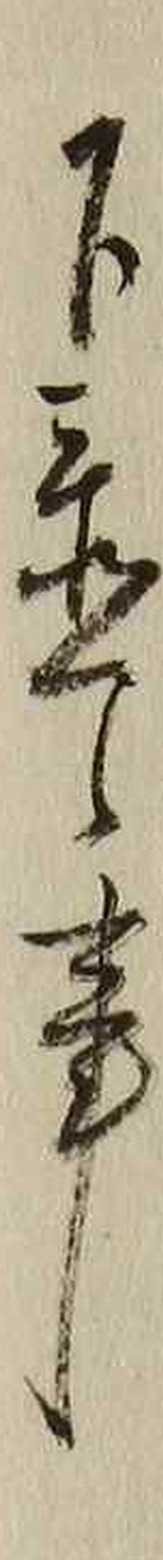下置候事
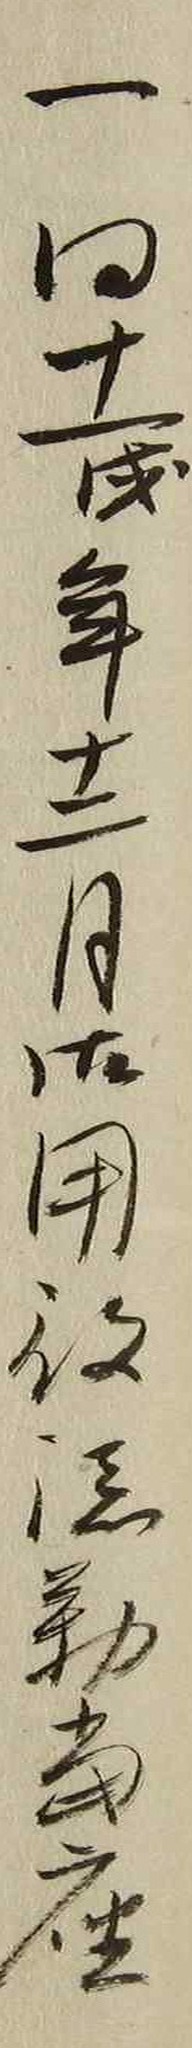一同十一戌年十二月御用役諸勤当座
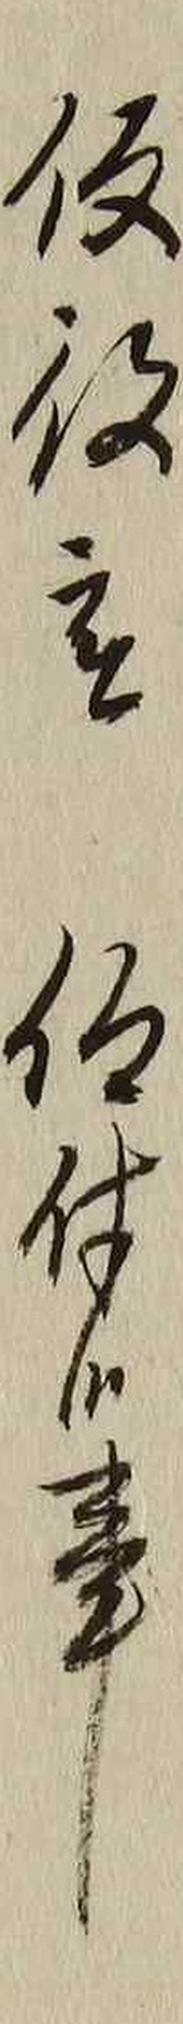仮役被仰付候事
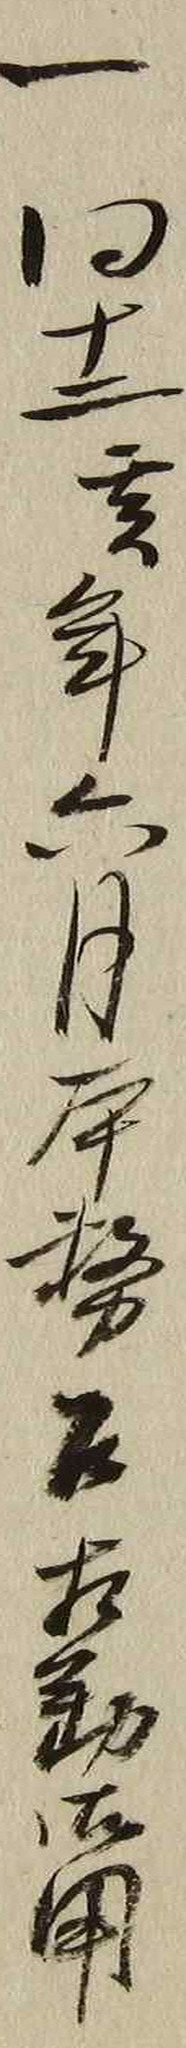一同十二亥年六月本務乍相勤御用
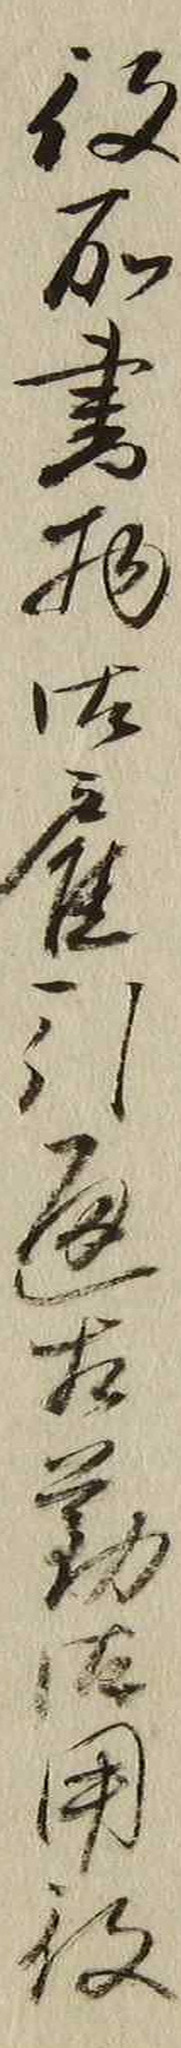役所書物御雇引通相勤御用役
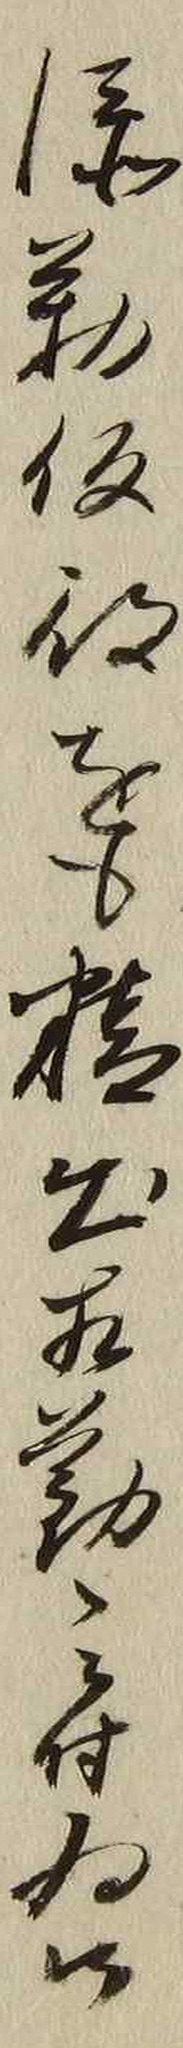添勤仮役をも精出相勤候ニ付為御
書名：諸士系譜　巻之352　す之部2
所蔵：会津若松市立会津図書館
